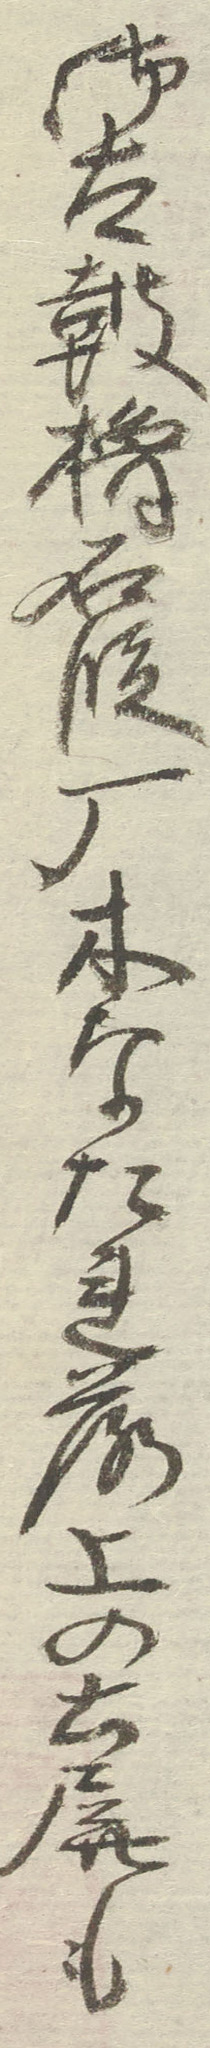御太皷櫓石段雁木なたれ落上の土屏も
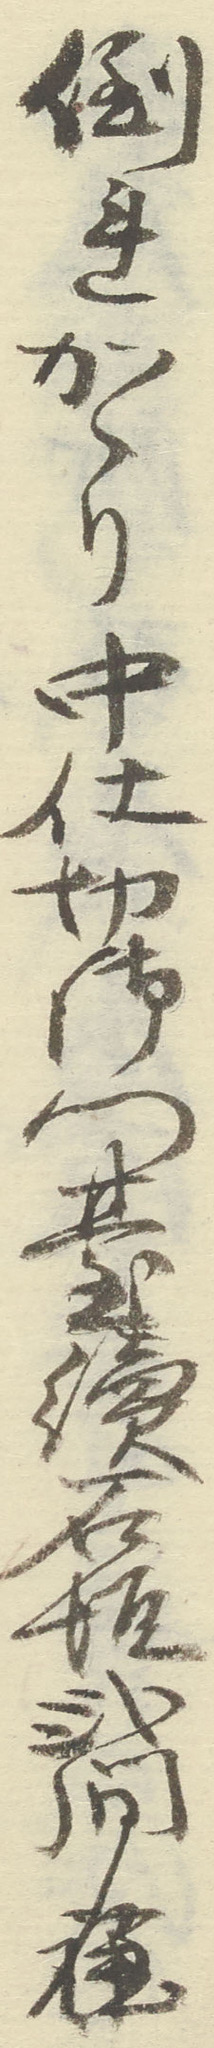倒れかゝり中仕切御門臺續石垣弐間程
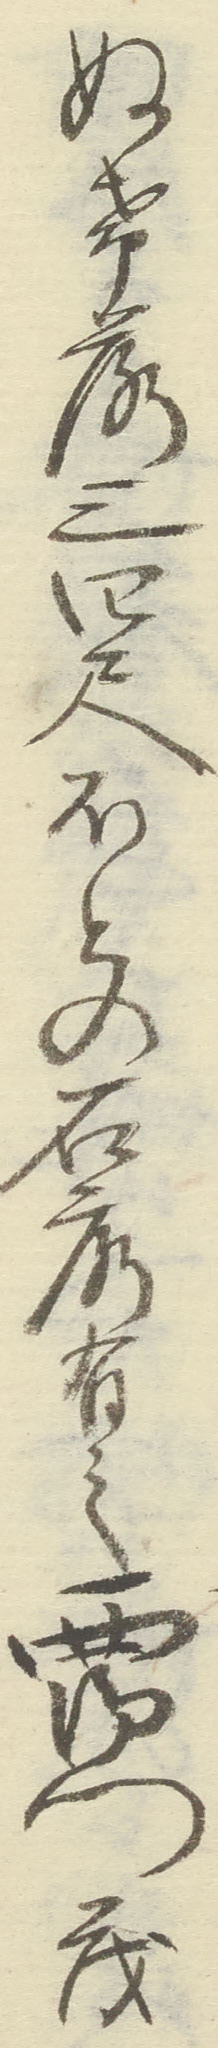ぬけ落三四尺ほとの石落有之西御門も
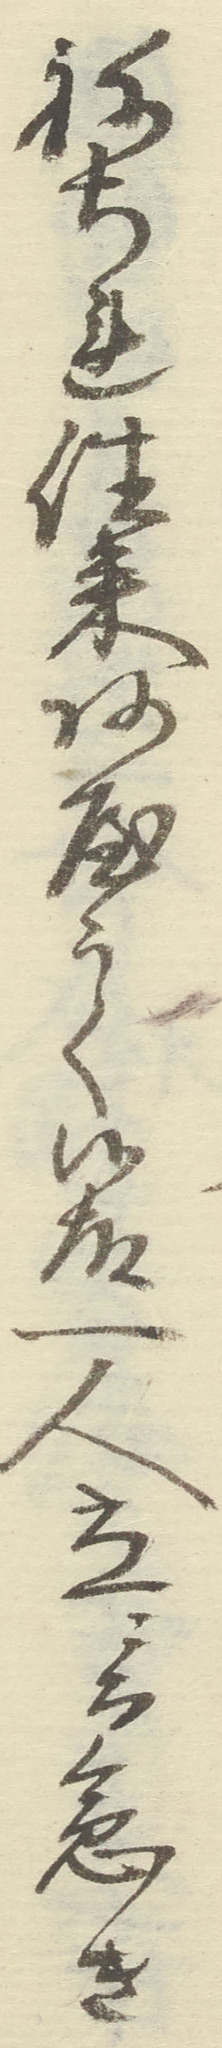ねちれ往来あやうく候故一人立ニ而急き
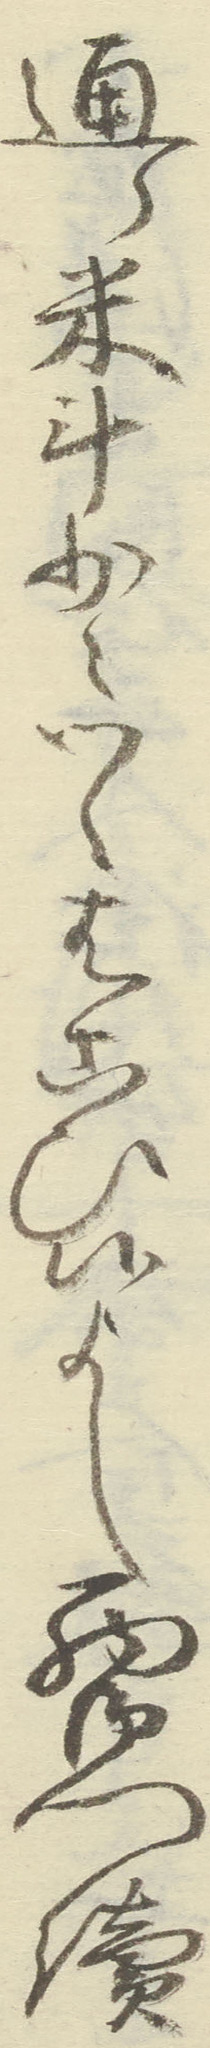通り米斗少〻ツヽはこひ候よし西御門續
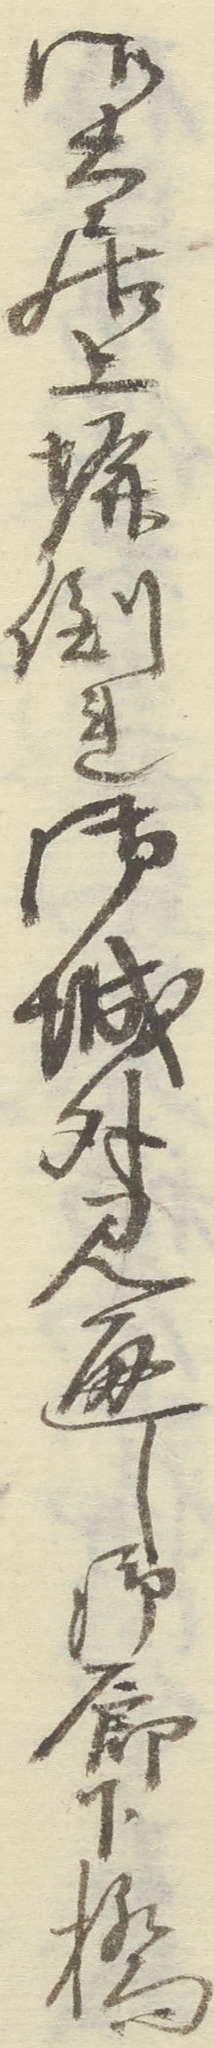御土居上塀倒れ御城外見通し御廊下橋
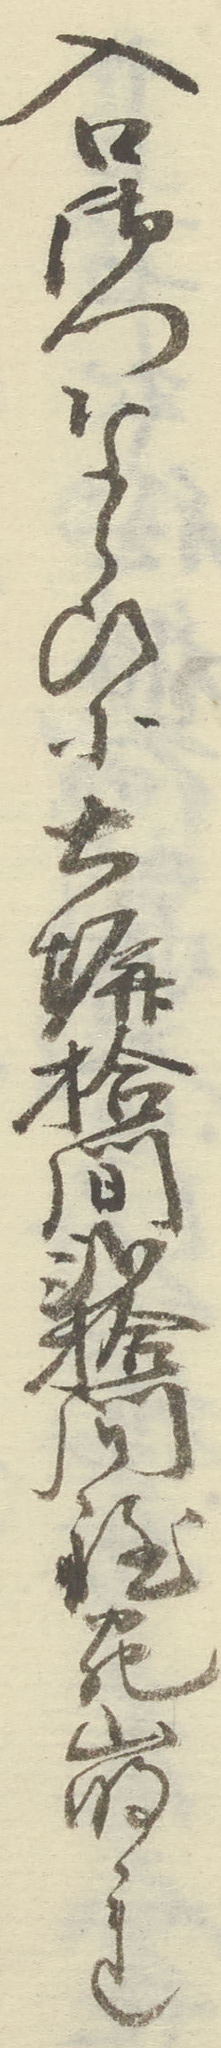入口御門ならひに土塀拾間弐拾間程宛崩れ
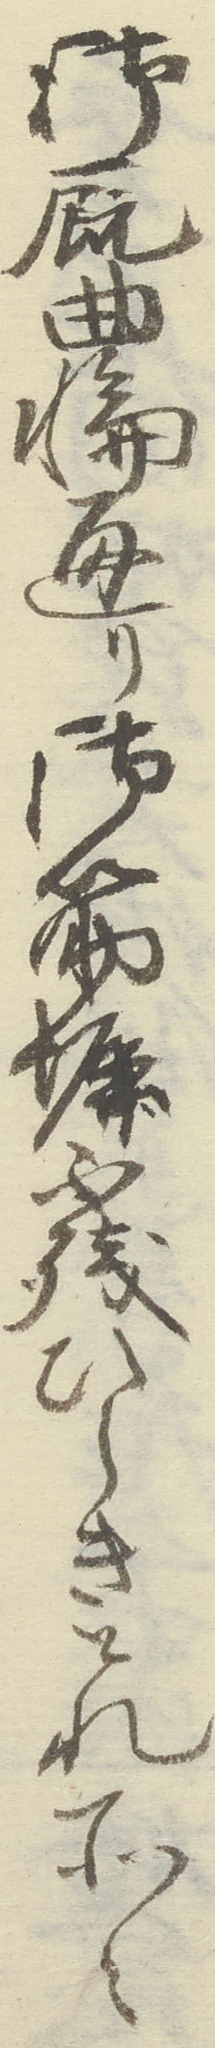御厩曲輪通り御筋堀不残ひしきとれ所〻
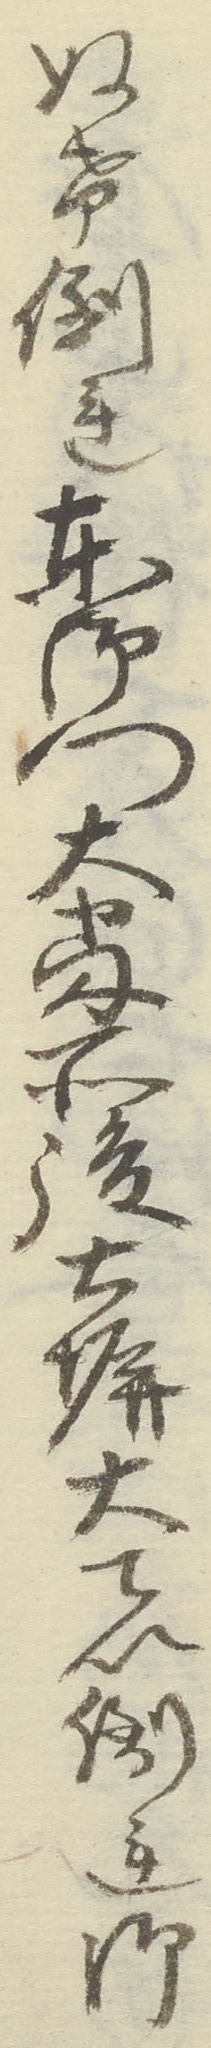ぬけ倒れ東御門大番所後土塀大てい倒れ御
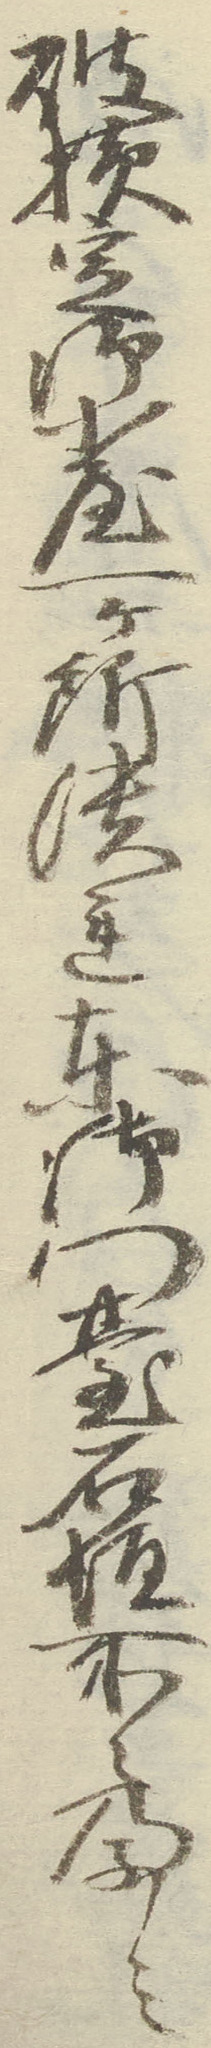破損定御小屋一ヶ所潰れ東御門臺石垣所〻孕ミ

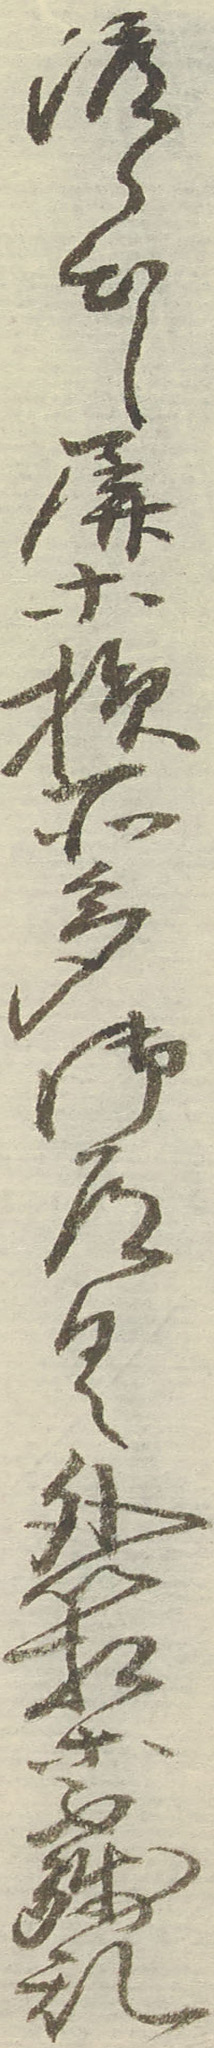渡り出し屏抔損所多御道具外箱抔不残乱
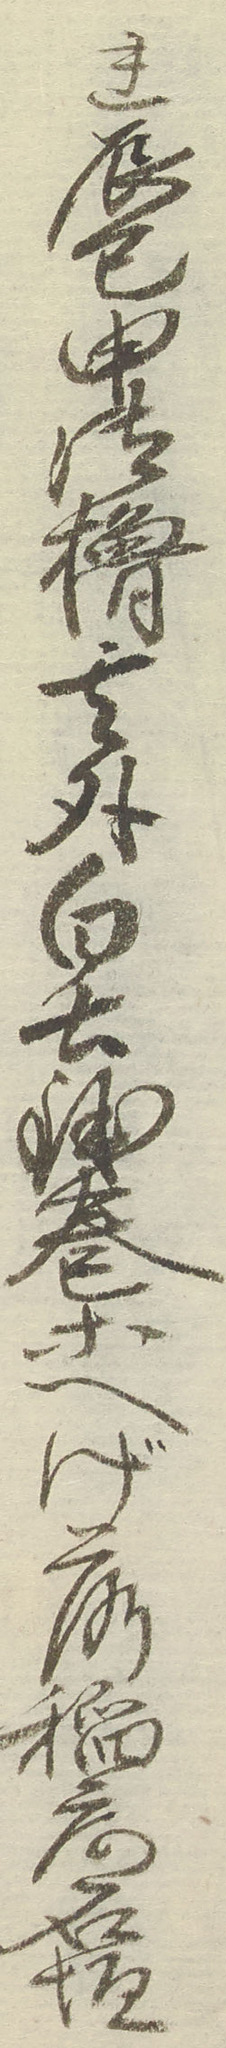れ辰巳申御櫓其外白土鉢巻抔へげ落稲荷石垣
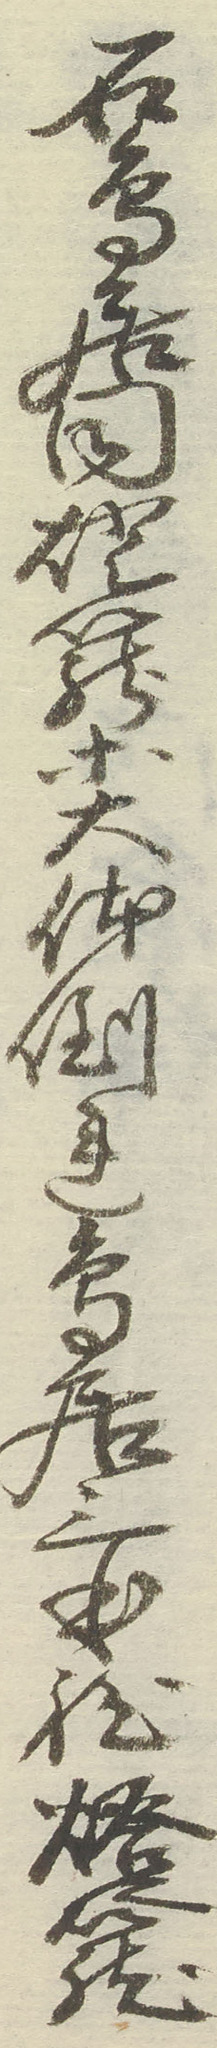石鳥居同燈籠抔大体倒れ鳥居三本程燈籠
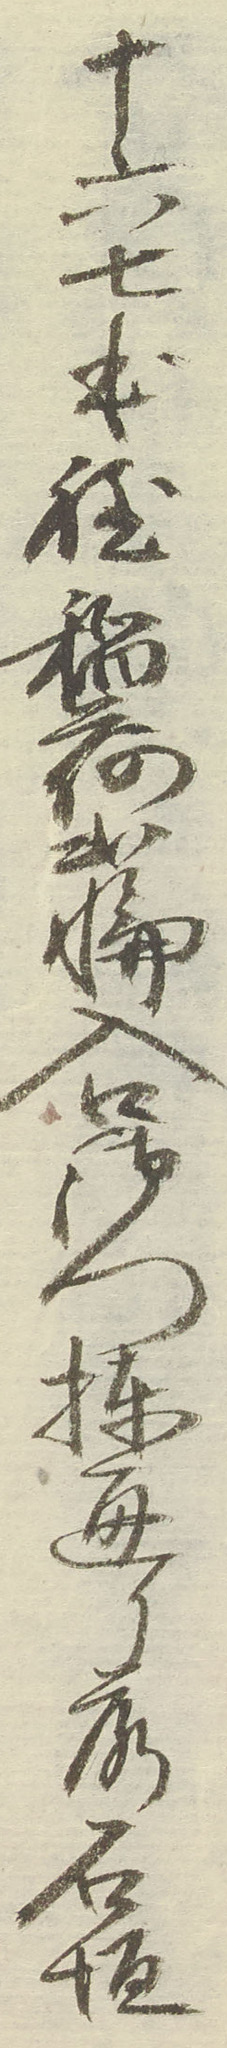十六七本程稲荷曲輪入口御門棟通り落石垣
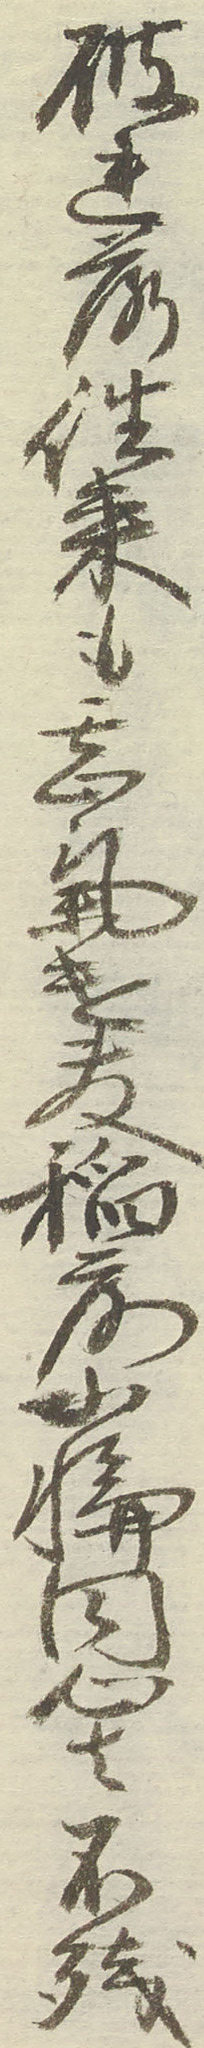破れ落往来も甚氣遣敷稲荷曲輪同心は不残
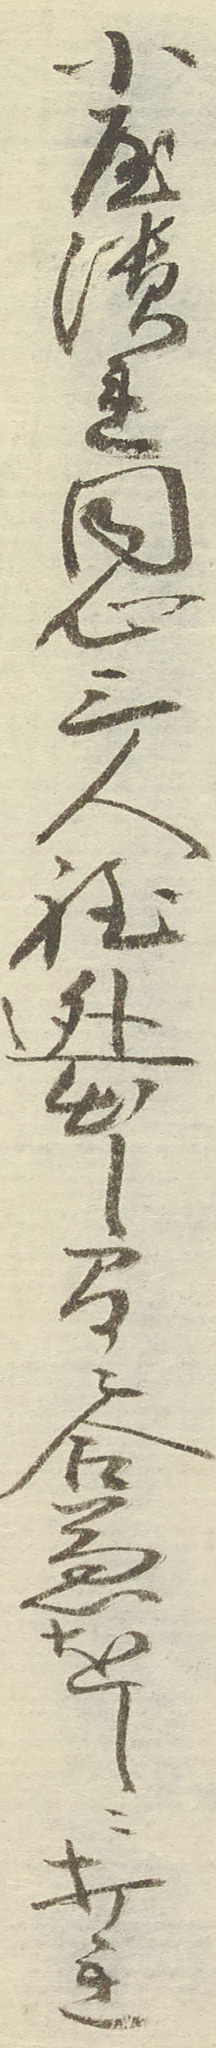小屋潰れ同心三人程迯出し間ニ合兼をしニ打れ
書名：[七月二日京都大地震に付御番衆大木市左衛門より申し越し候書面畧書状写]
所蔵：東京大学総合図書館 General Library in the University of Tokyo, JAPAN
